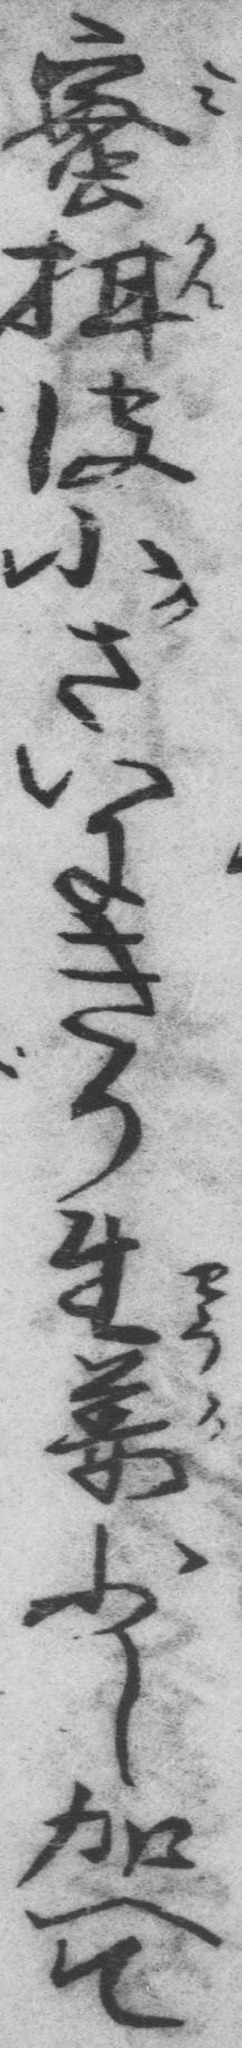蜜柑皮小くさいにきり生姜少し加へて
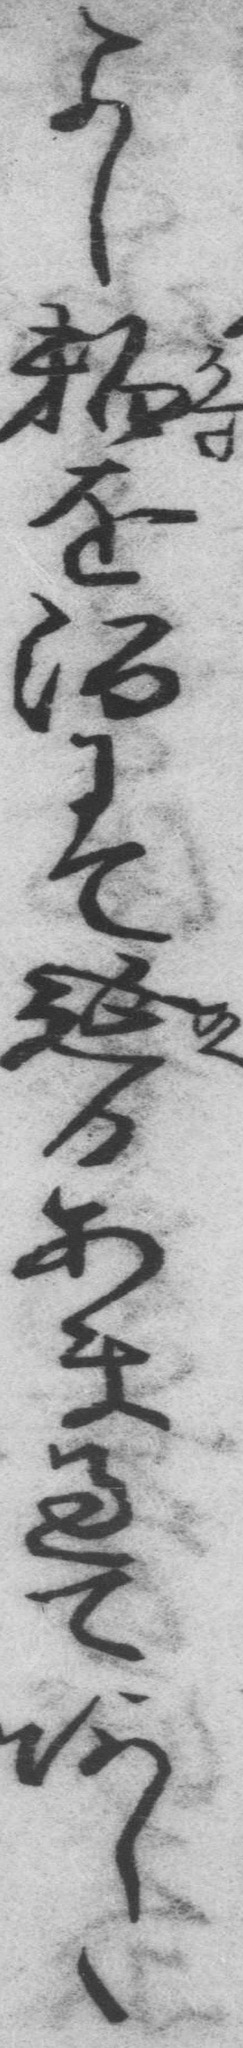よし粕を酒にて延るあま過てあしく
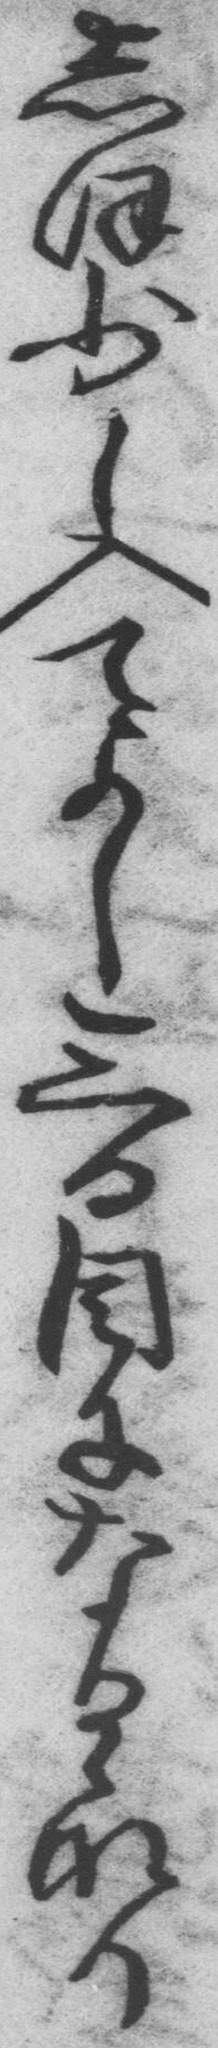しほ少し入てよし三日目になるゝなり
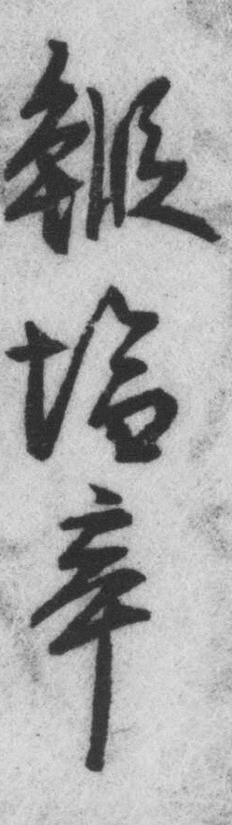鰕塩辛
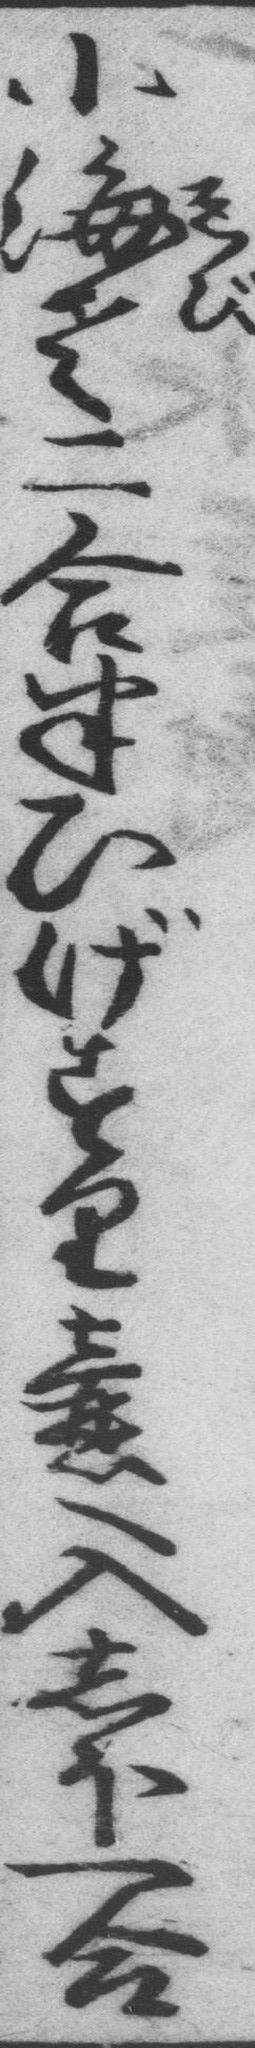小海老二合半ひげすり壺へ入しほ一合
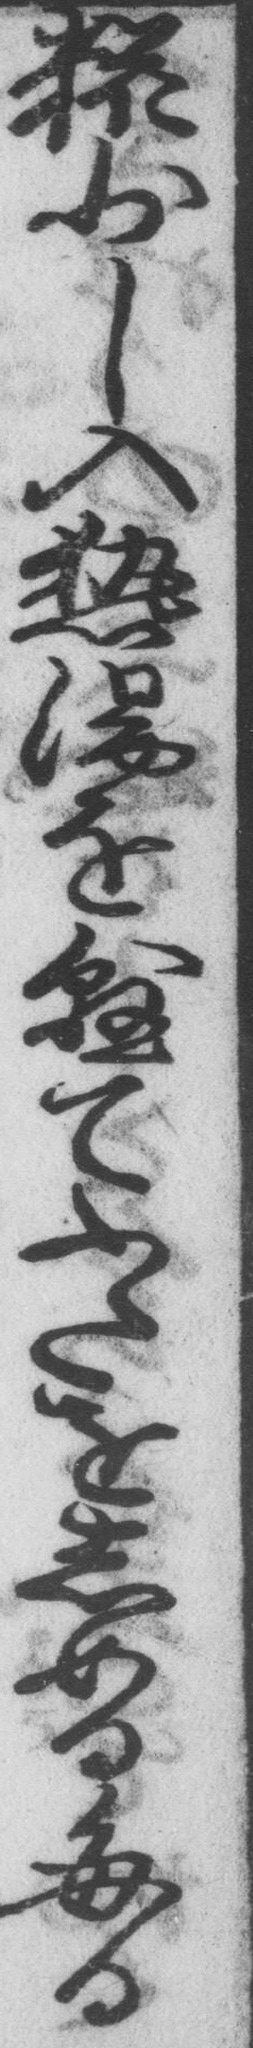糀少し入熱湯を懸てふたをしめる毎日
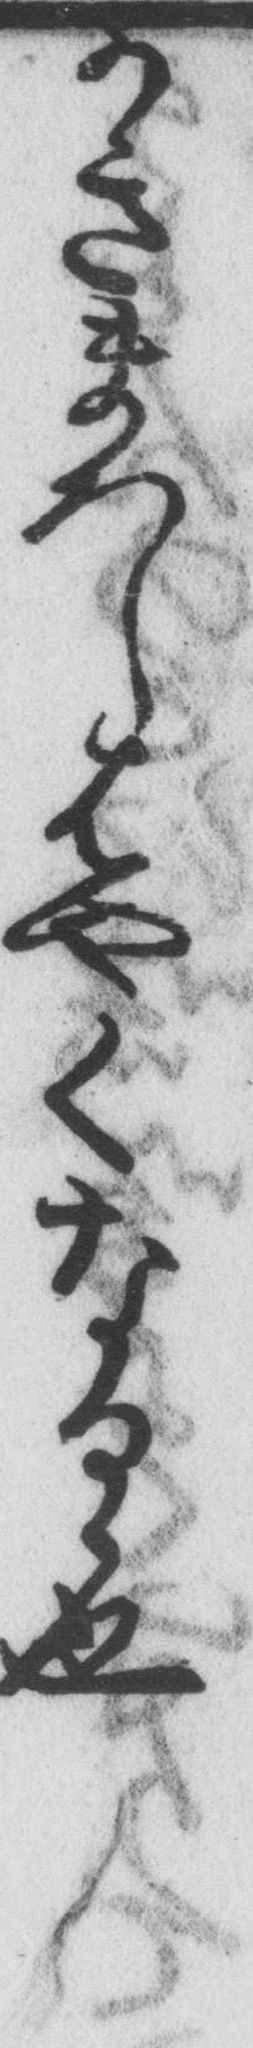かきまはしはやくなるゝ也
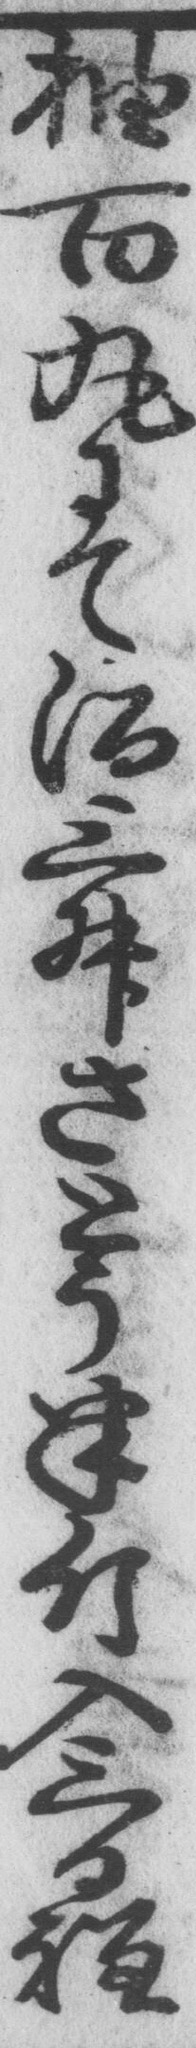柚百丸にて酒三升さとう半斤入三日程
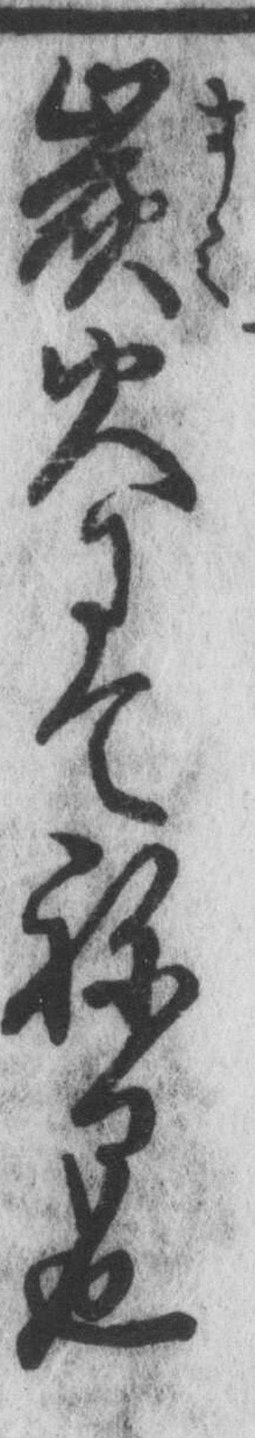炭火にてねる也
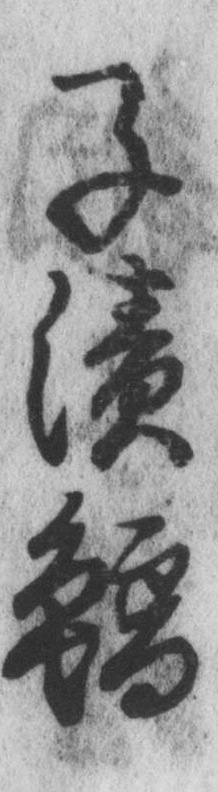子漬鱈
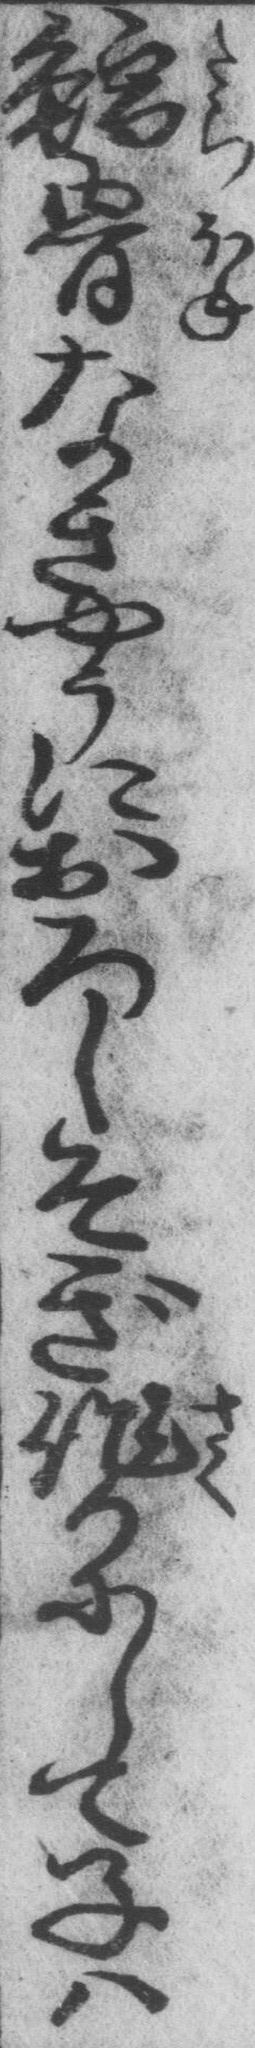鱈骨なきやうにおろしそぎ作りにして子は

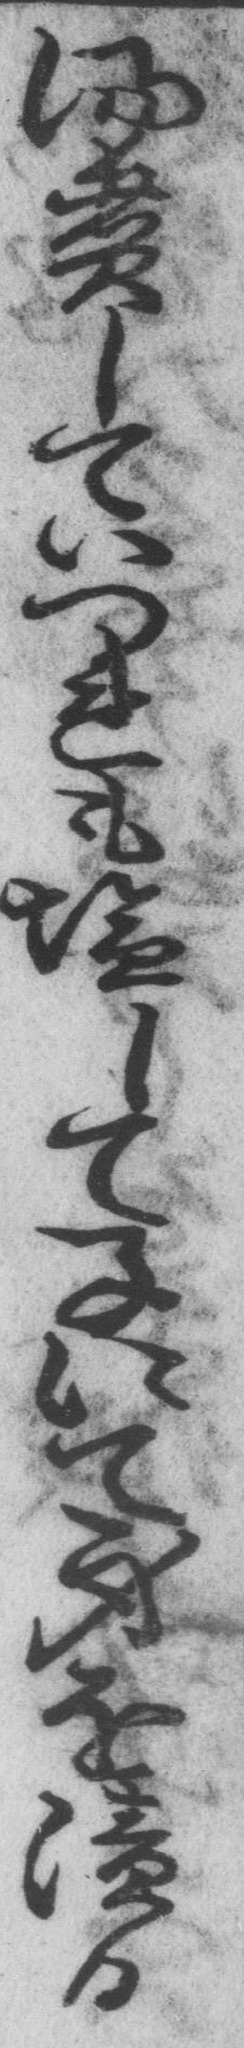湯煮していつれも塩して子にて身を漬る
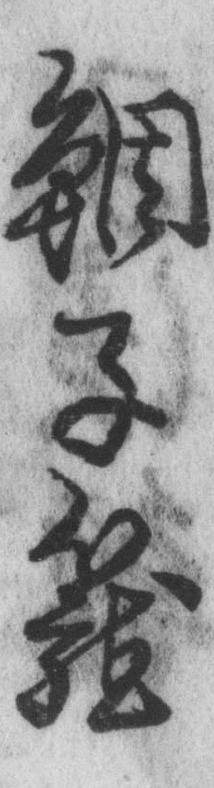鯛子籠
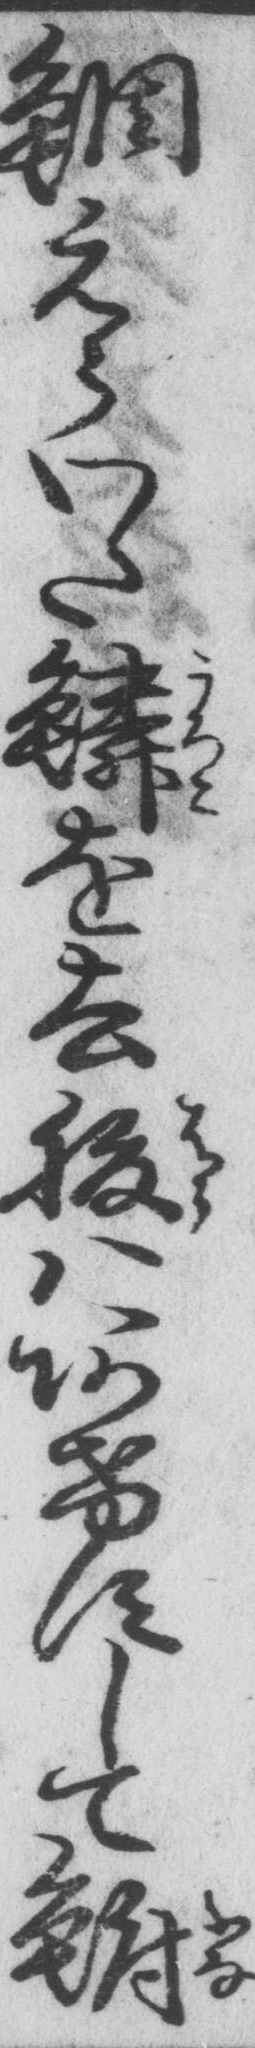鯛えらわた鱗を去腹はあけすして鮒
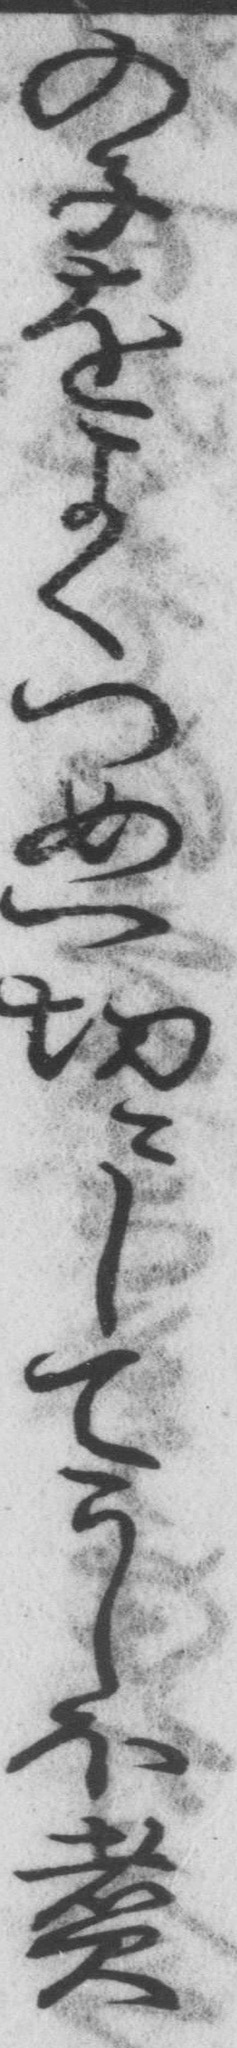の子をよくつめい一切にしてうしほ煮
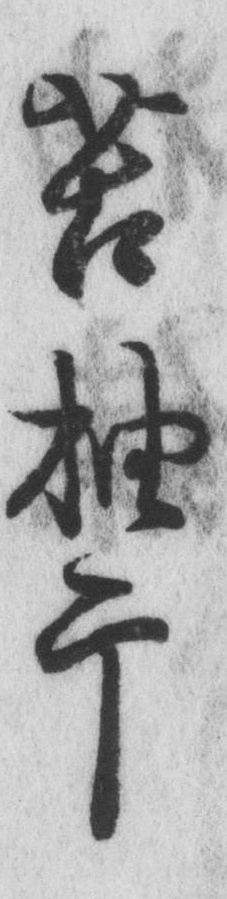苦柚干
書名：料理山海郷
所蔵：大阪府立大学学術情報センター 国文学研究資料館
